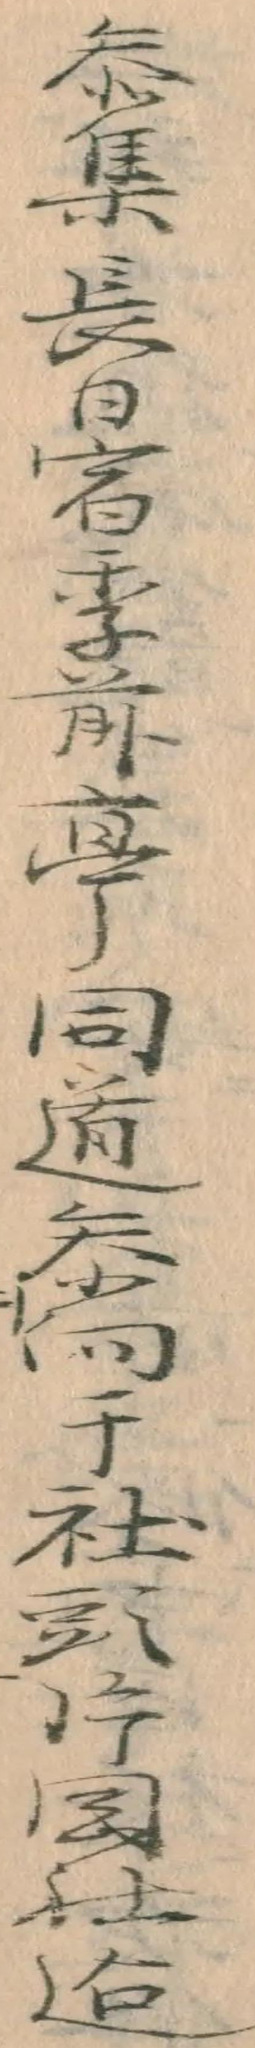参集長日宿季前亭同道参向于社頭片岡社迄
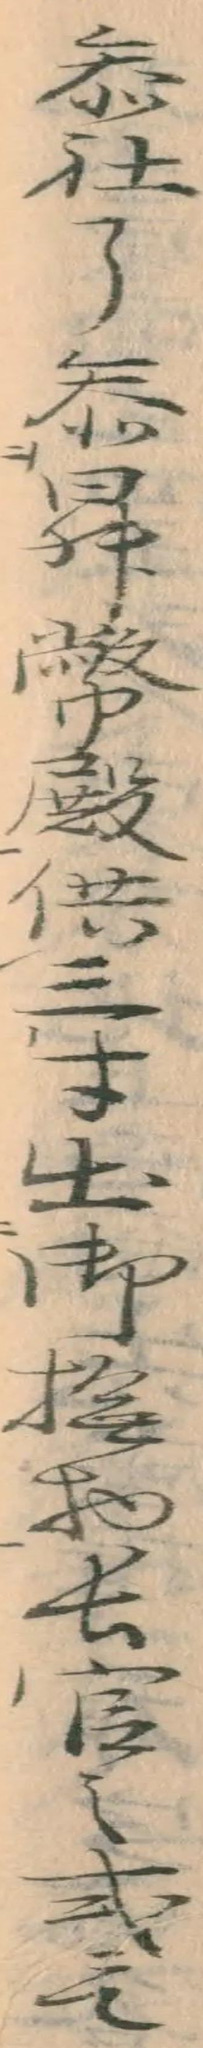参社了参昇幣殿供三寸出御撥物長官之式ニて
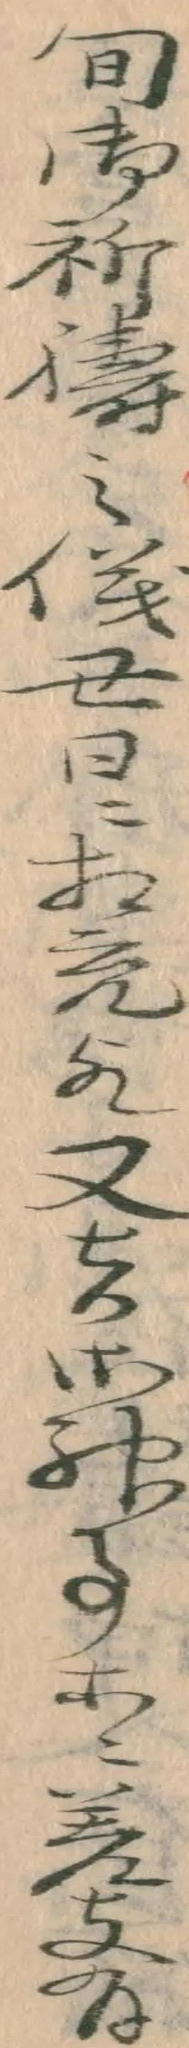一旬御祈祷之儀丑日ニ相充歟又右御神事等ニ差支有
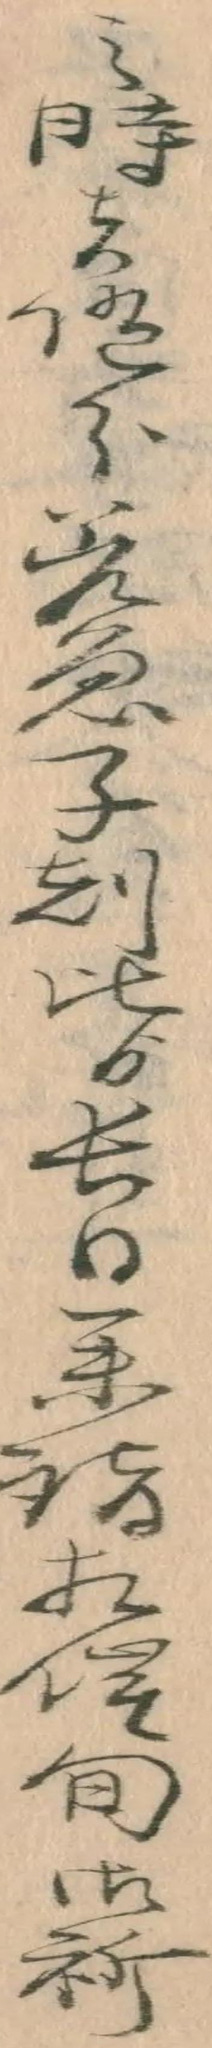之時者随分差急子刻頃ゟ長日参詣相催旬御祈
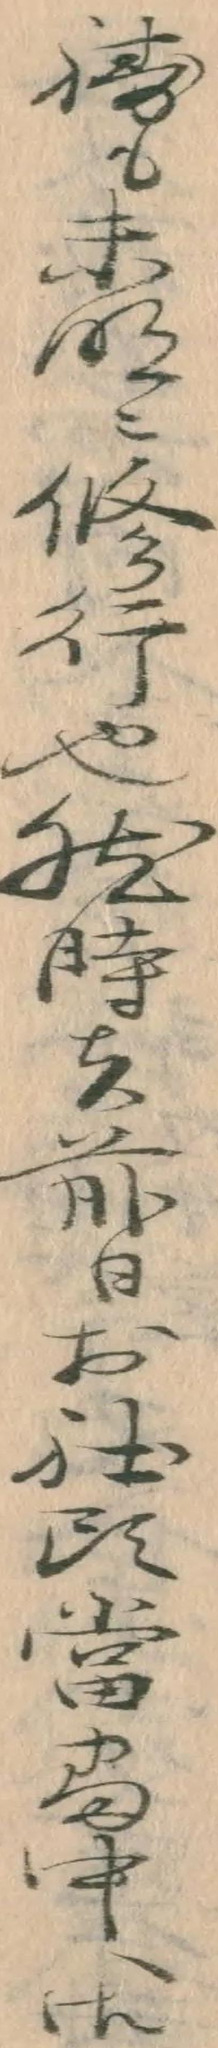祷も未明ニ修行也然時者前日於社頭當番中へ御
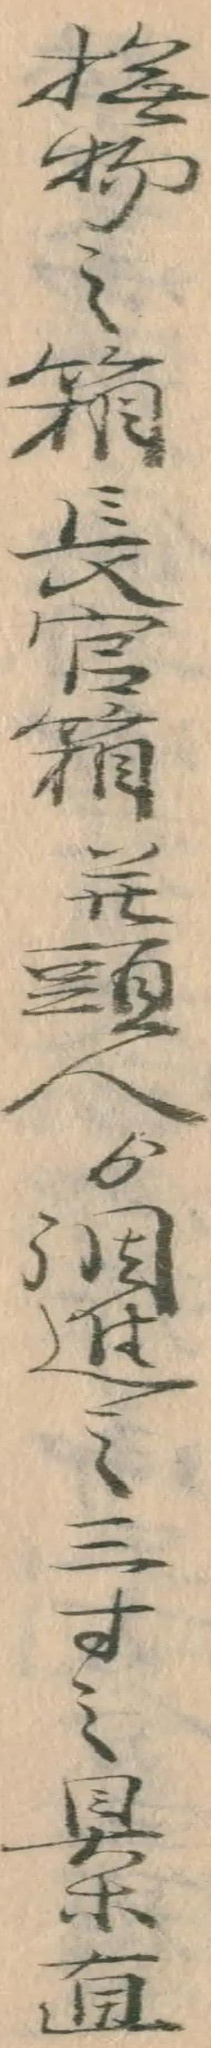撫物之箱長官箱并頭人ゟ調進也三寸之具等直
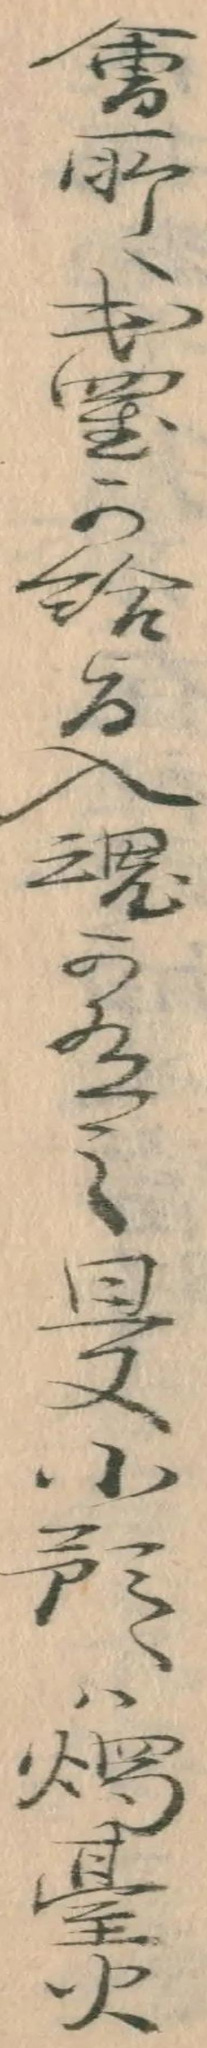會所へ出置可給旨入魂可有之且又小預へハ燭臺火
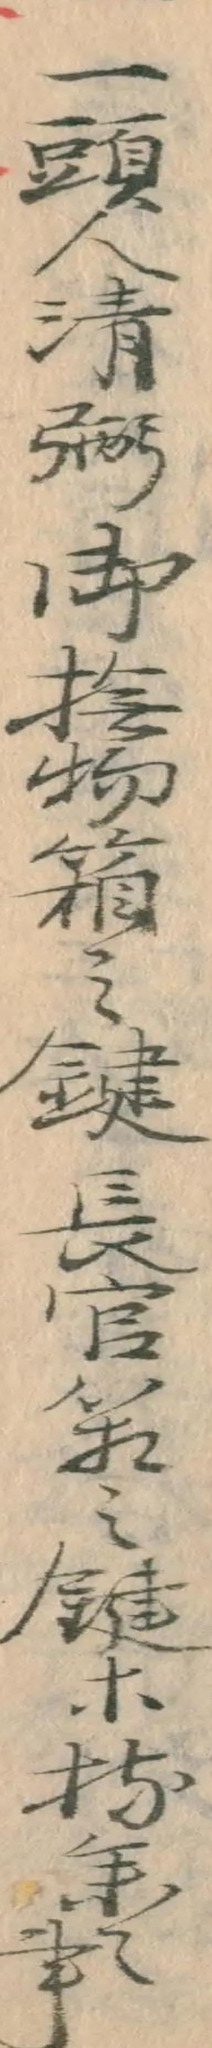一頭人清弼御撫物箱之鍵長官箱之鍵等持参之事
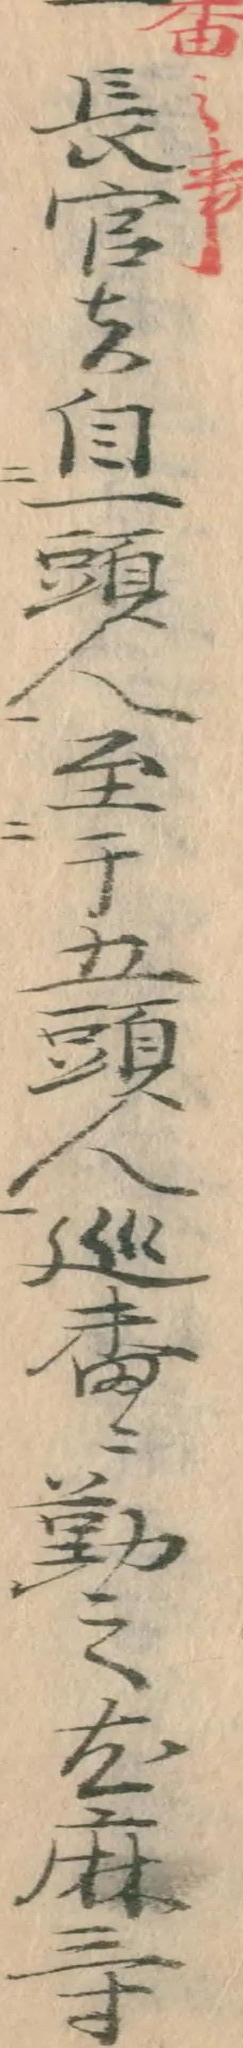一長官者自一頭人至于五頭人巡番ニ勤之尤麻三寸
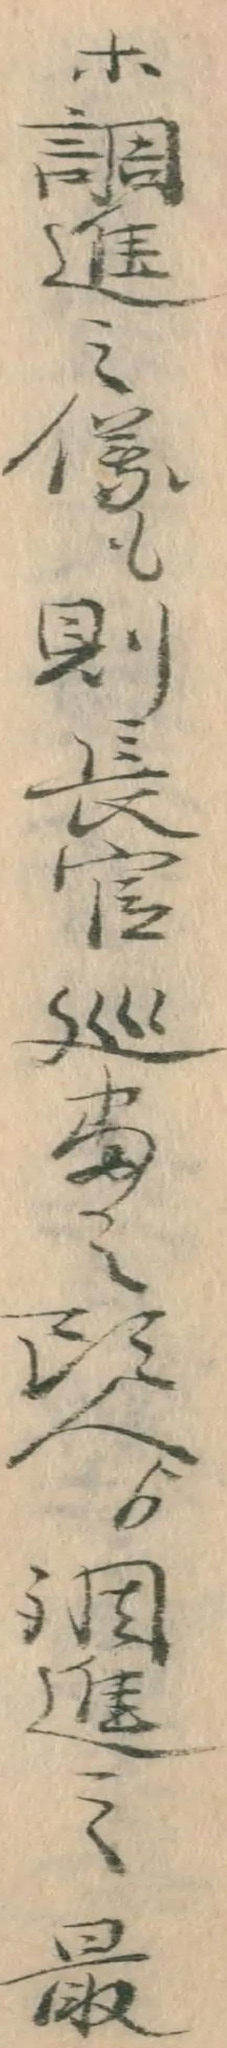等調進之儀も則長官巡番之頭人ゟ調進也最

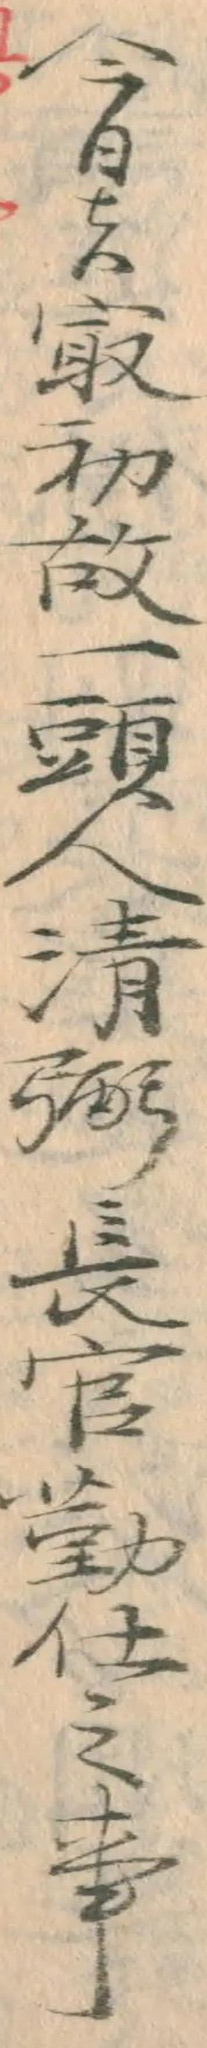今日者最初故一頭人清弼長官勤仕之事
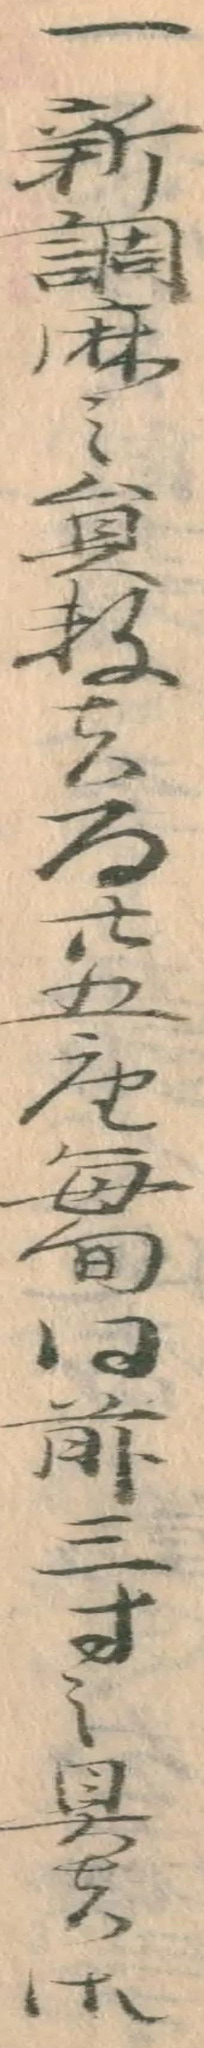一新調麻之員数者百廿五座毎旬同前三寸之具者御
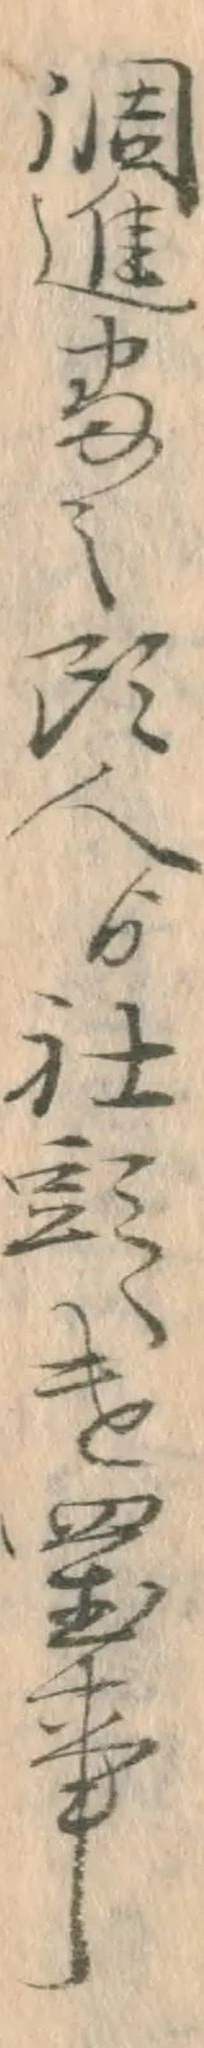調進番之頭人ゟ社頭へ遣置事
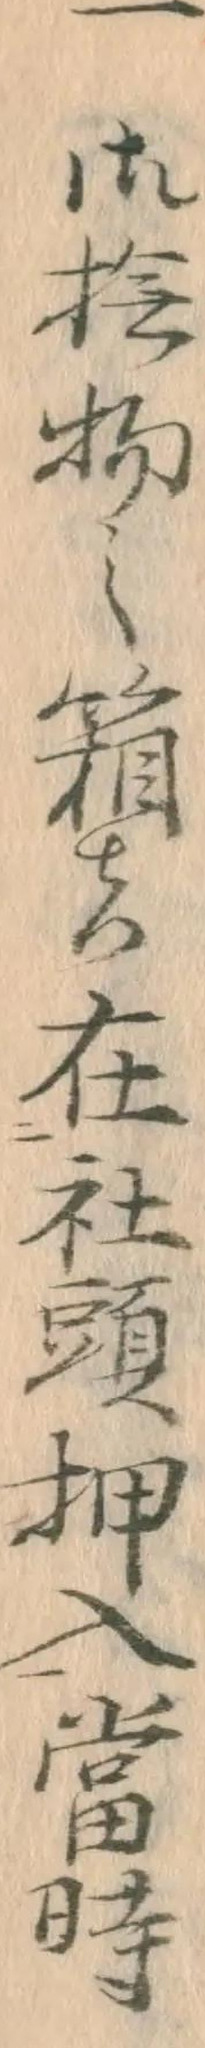一御撫物之箱者在社頭押入當時
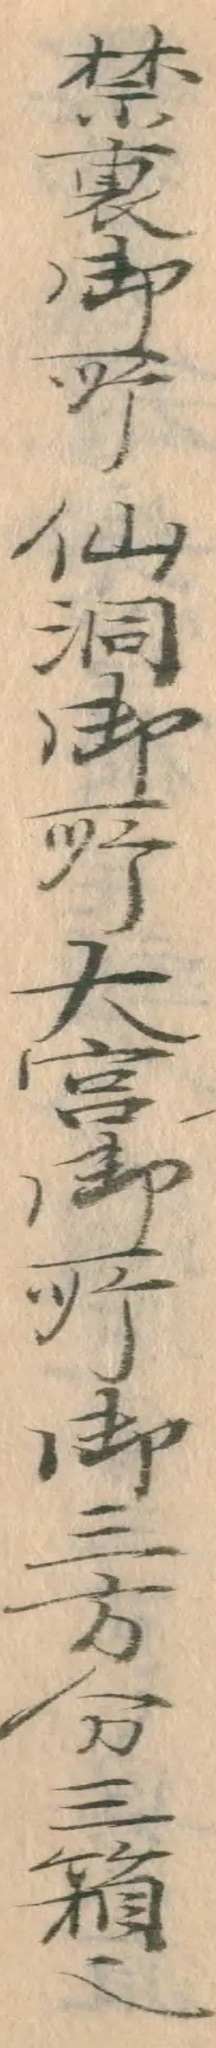禁裏御所仙洞御所大宮御所御三方分三箱也
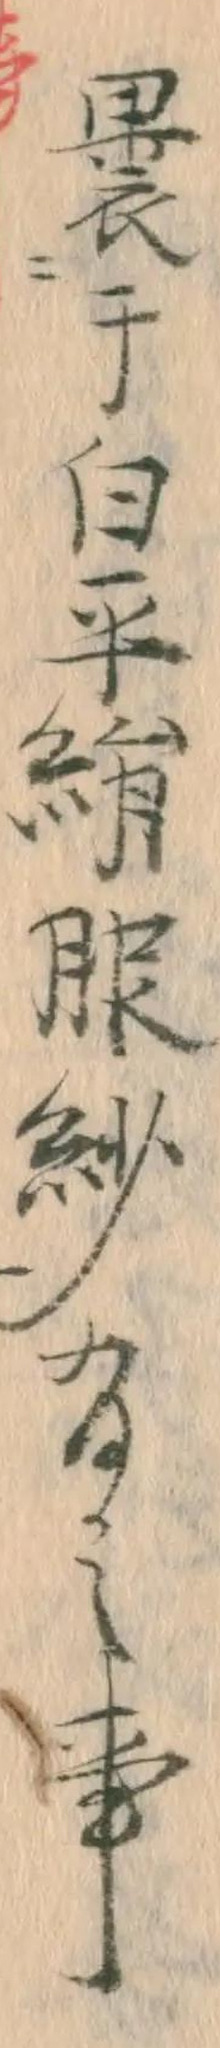褁于白平絹服紗有之事
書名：賀茂社記録. 第72冊
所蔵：国立国会図書館 National Diet Library, JAPAN
